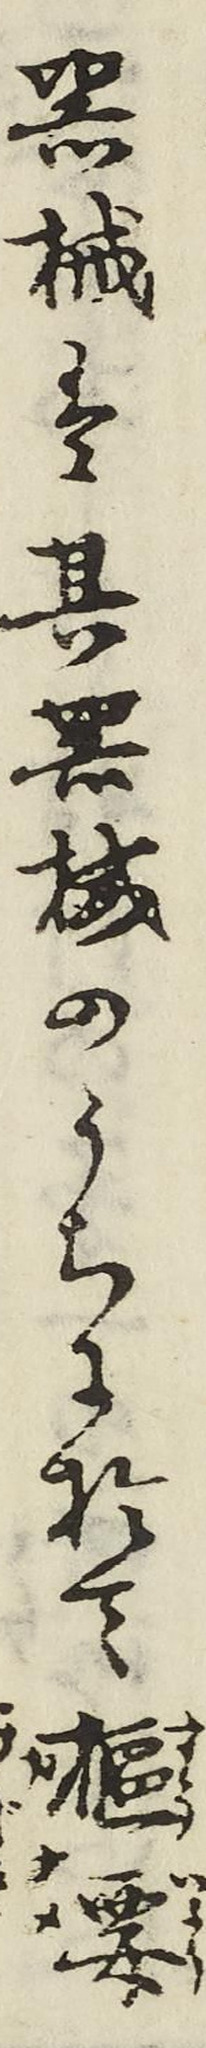器械は其器械のうちに於て枢要
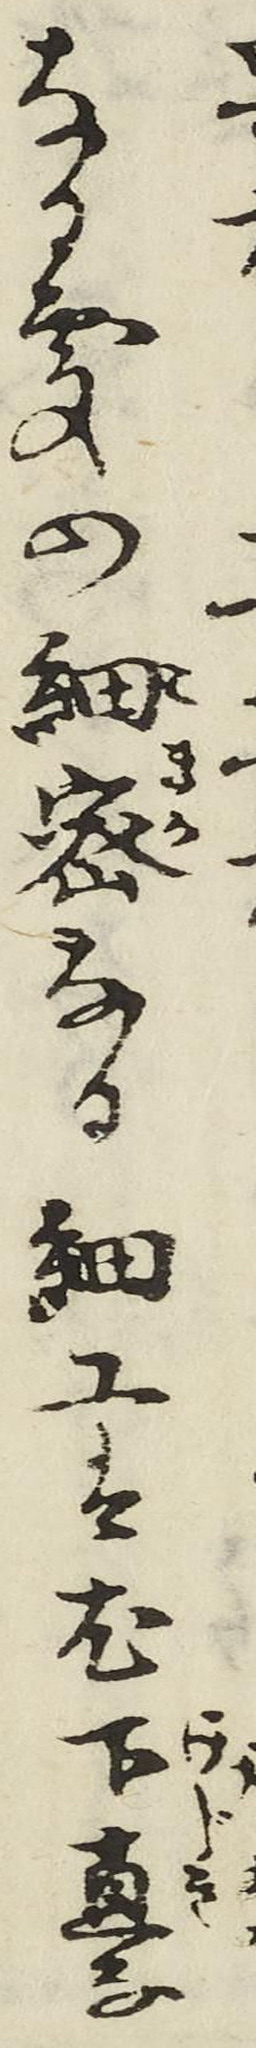なる処の細密なる細工は尤下直な
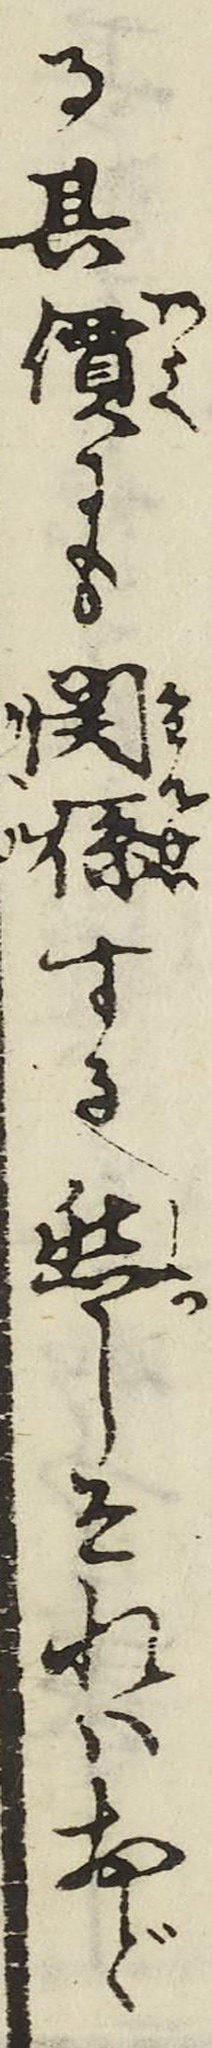る其価にも関係する然しそれはおど
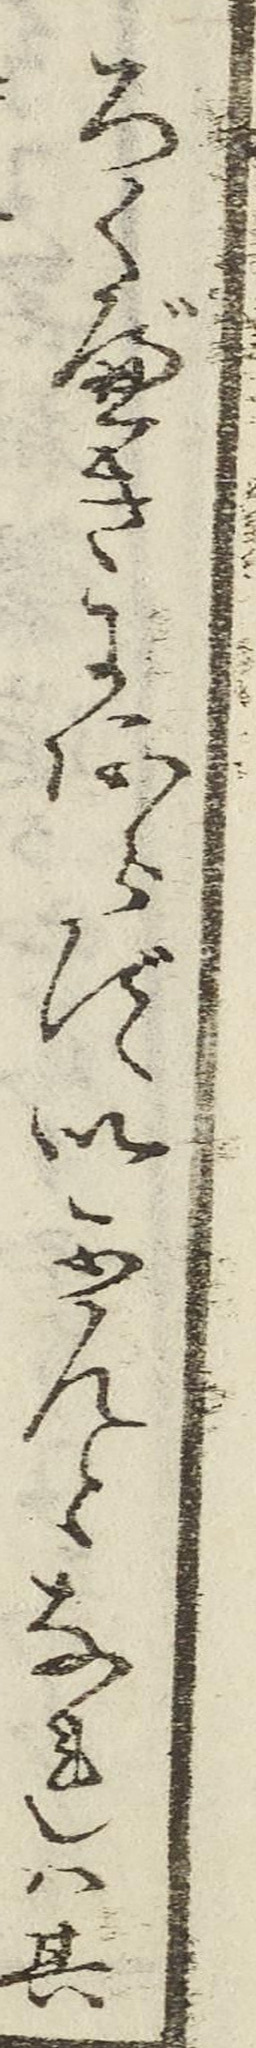ろくべきにあらずいかんとなれは其
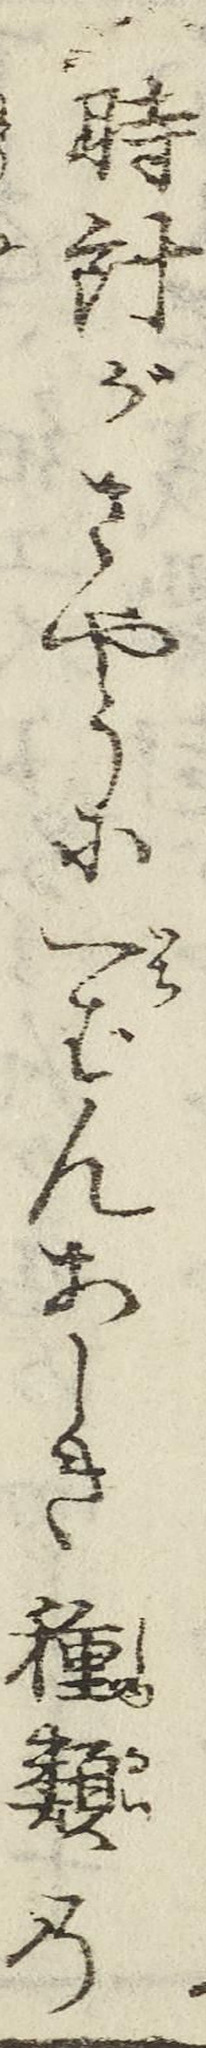時計がさやうに一ばんあしき種類の
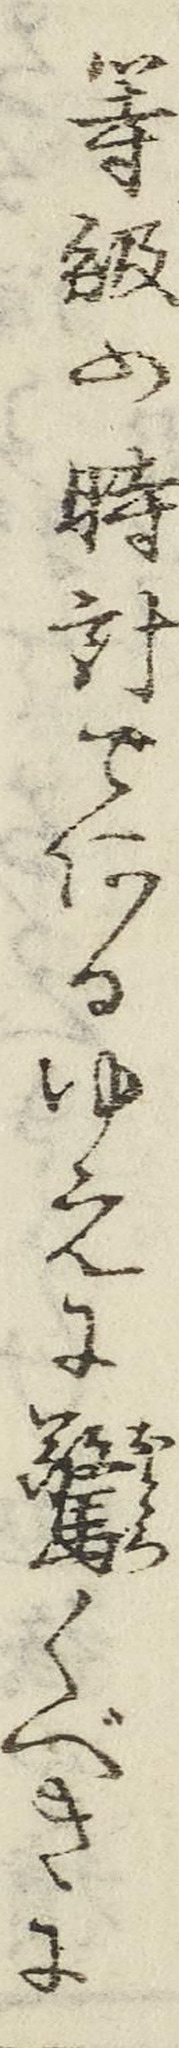等級の時計であるゆえに驚くべきに
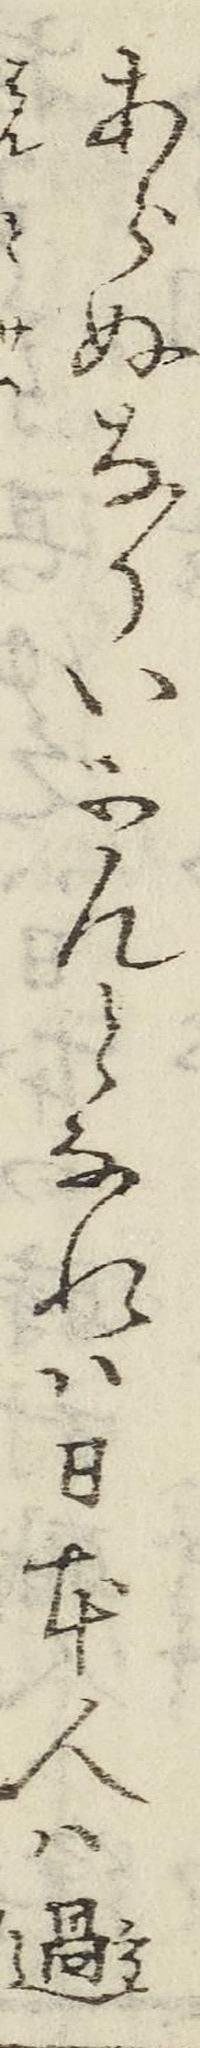あらぬなりいかんとなれは日本人は過
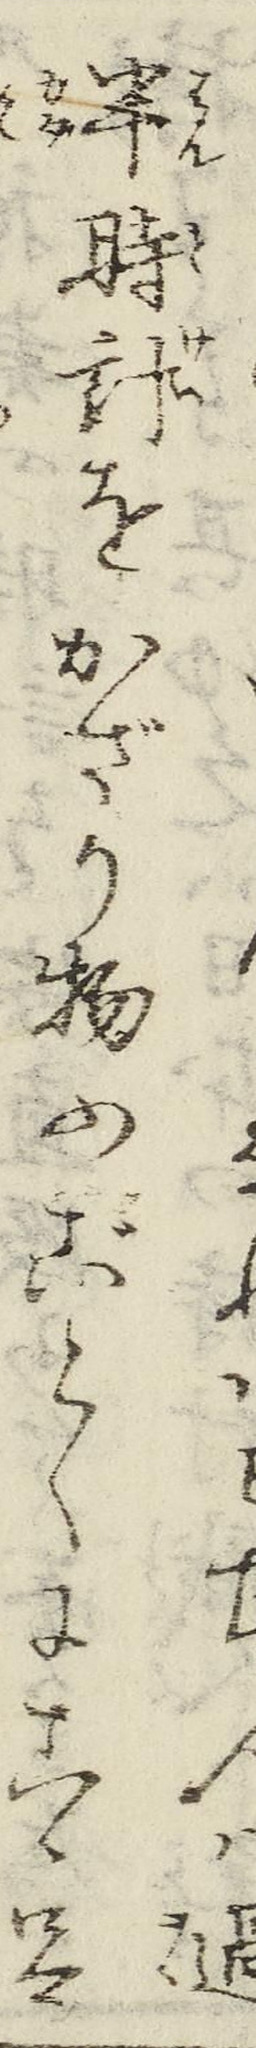半時計をかざり物のごとくにこゝろ
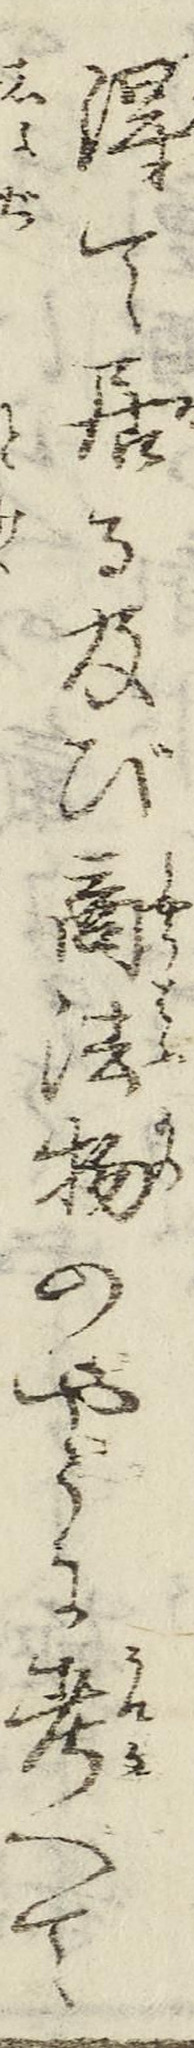得て居る及び商法物のやうに考へて
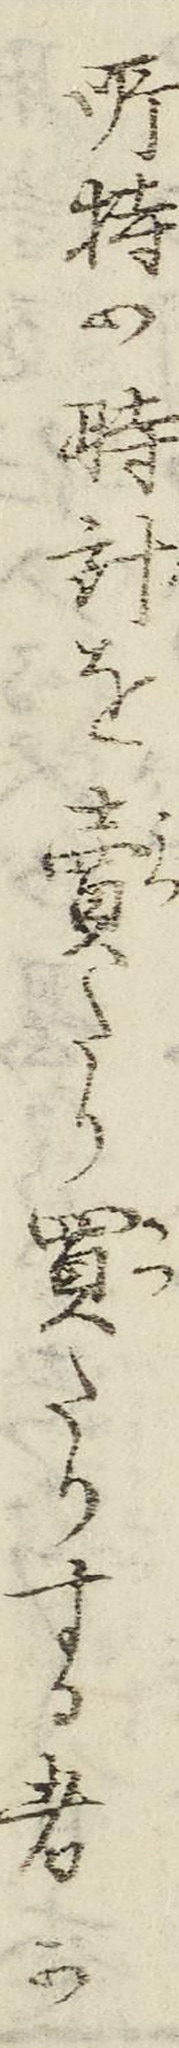所持の時計を売たり買たりする者か
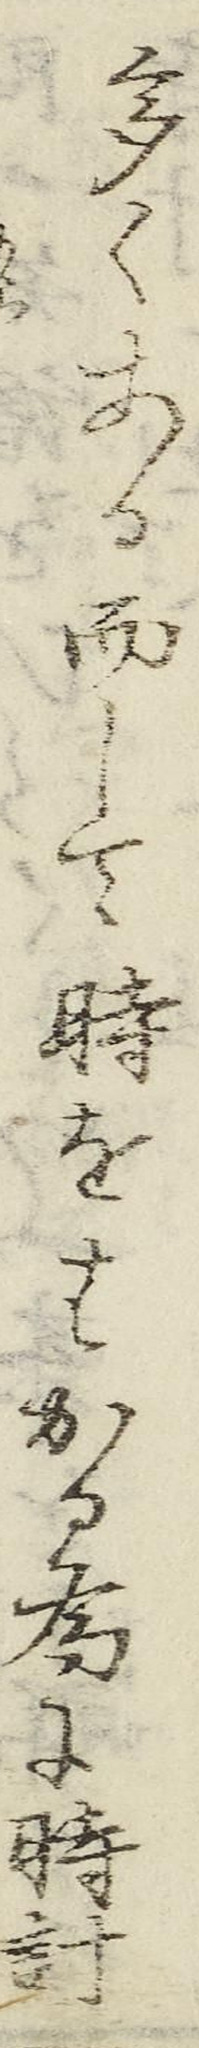多くある而して時をはかる為に時計
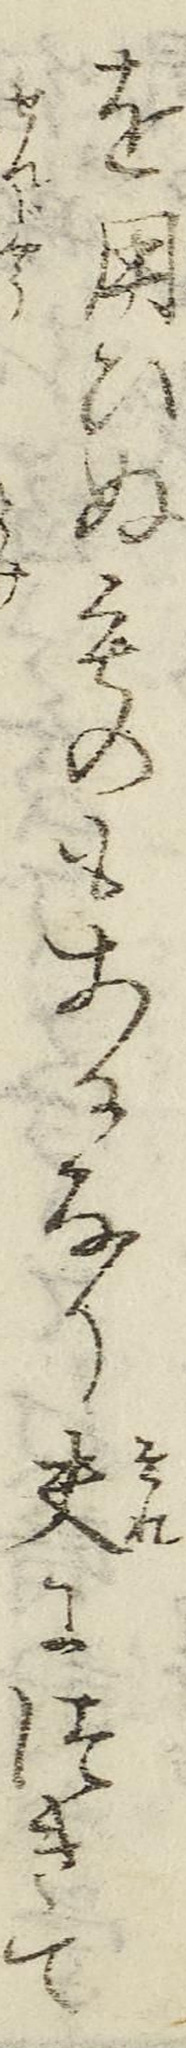を用ひぬものもあるなり夫につきて
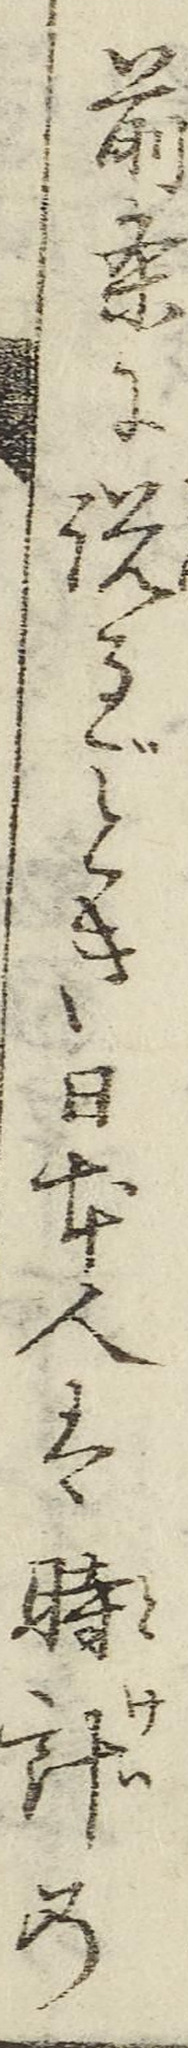前条に説るごとき日本人は時計の

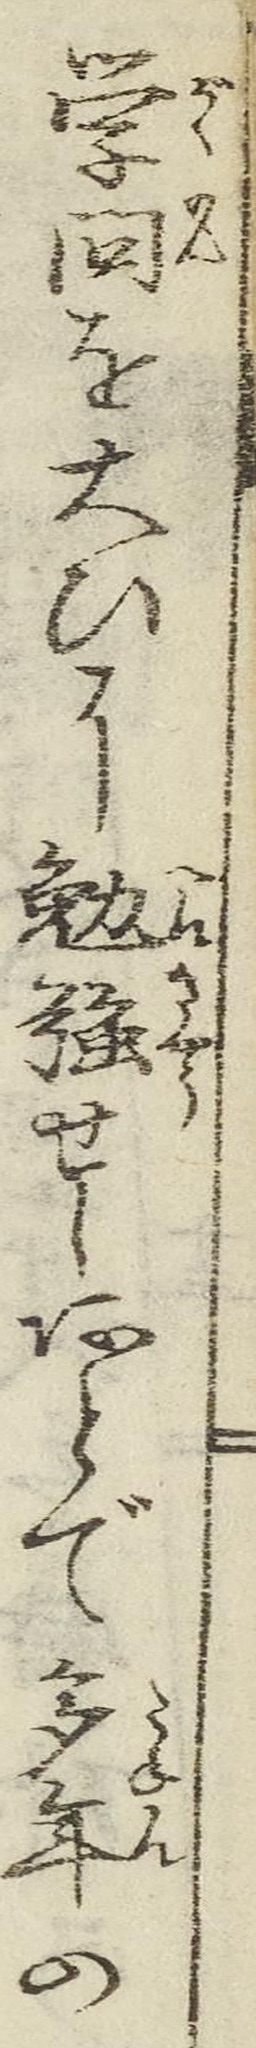学問を大ひに勉強せしあとで多年の
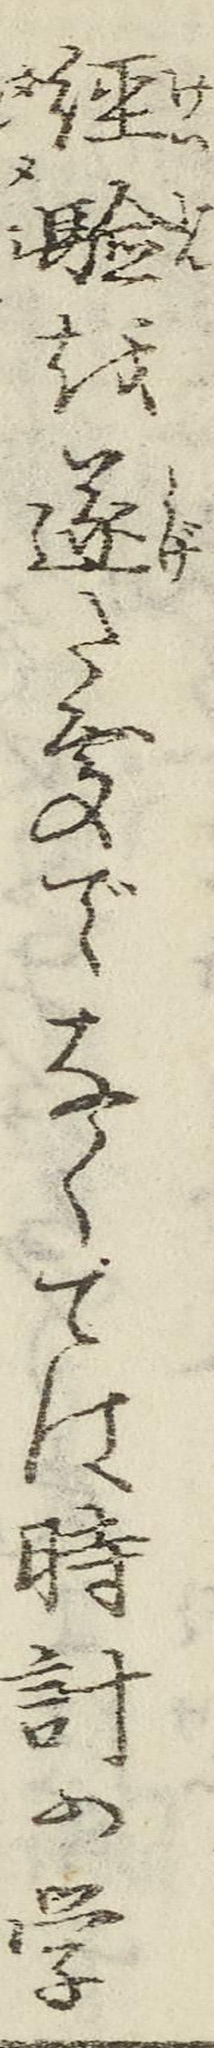経験を遂た処でなくては時計の学
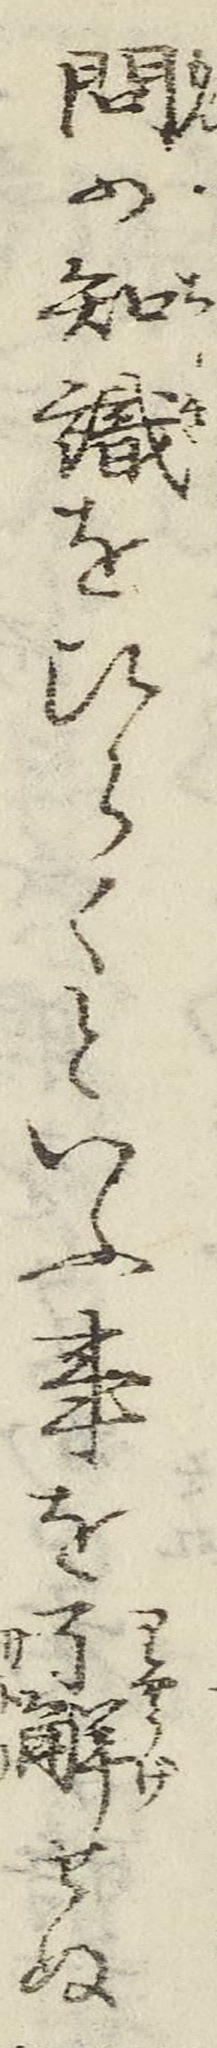問の知識をひらくといふ事を了解せぬ
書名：[時計に関する冊子]
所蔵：東京大学地震研究所図書室 Earthquake Research Institute Library, The University of Tokyo, JAPAN
